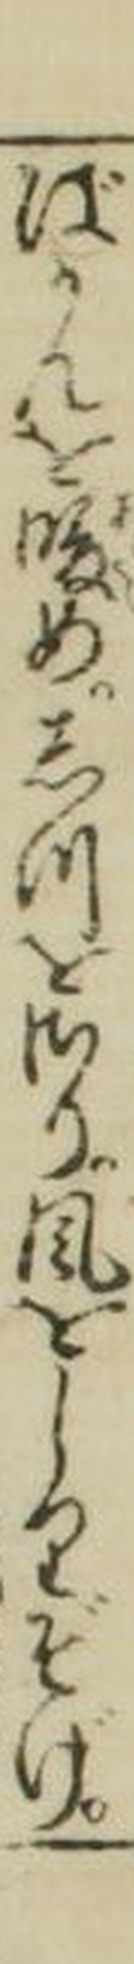ばかんを暖め。しつをさり。風をしりぞけ。
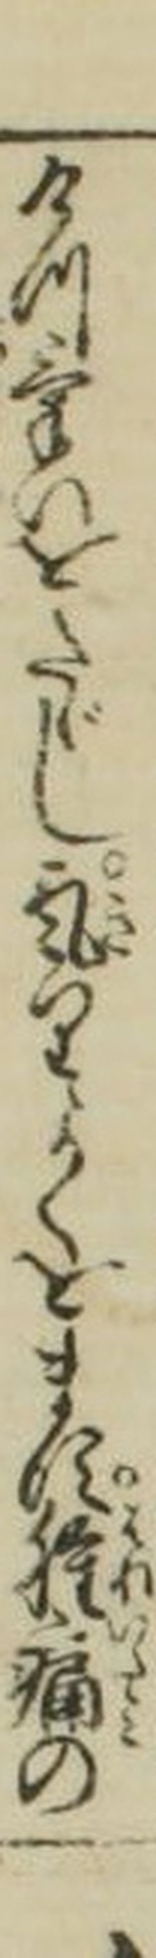けつけいをたゞし。気りよくをます。腫痛の
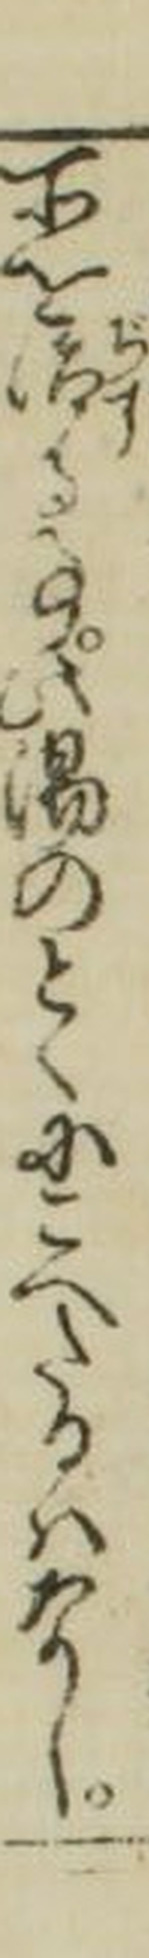所を治る事。此湯のとくにこへたるはなし。
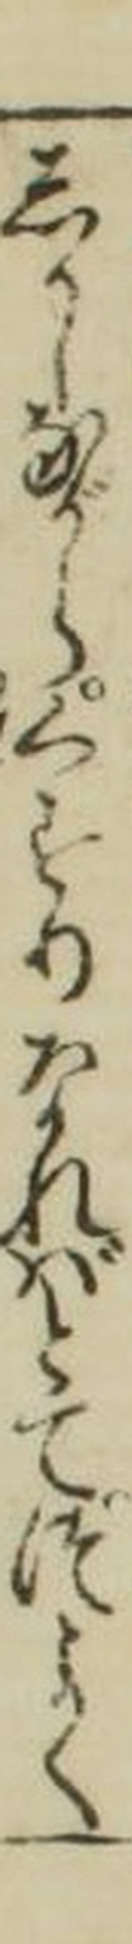しかしながら。くすりなればとて。つよく
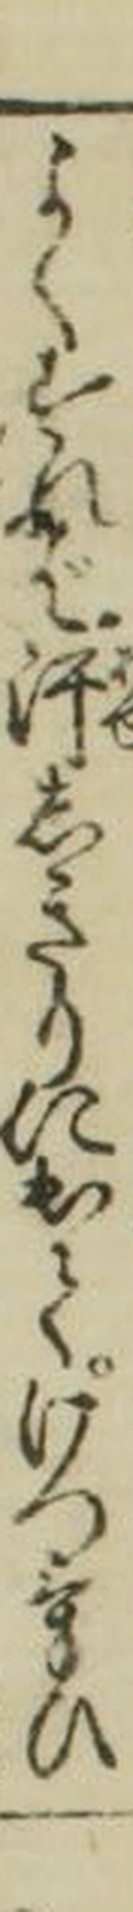よくすれば。汗しきりに出て。けつけい
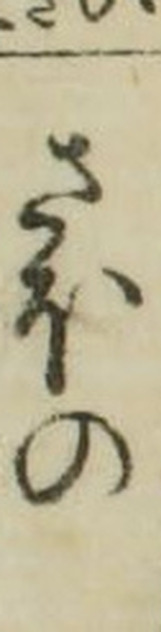さほの
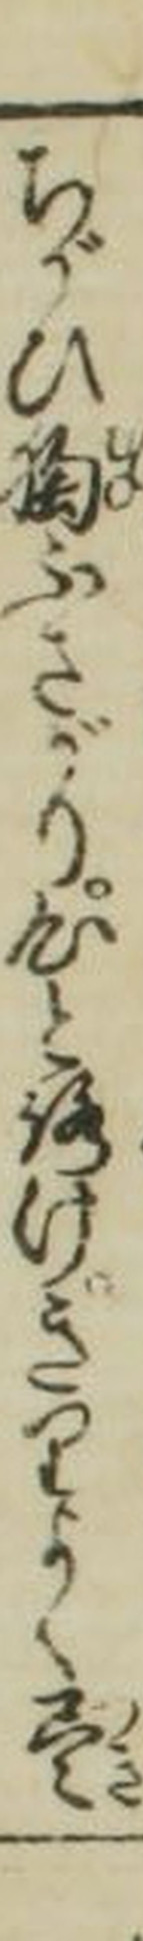ちがひ胸ふさがり。心とろけ。きりよく尽
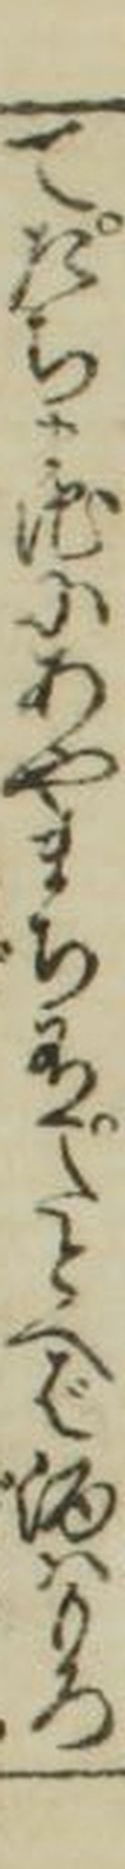て。たちまちにあやまち有。たとへば酒はもろ
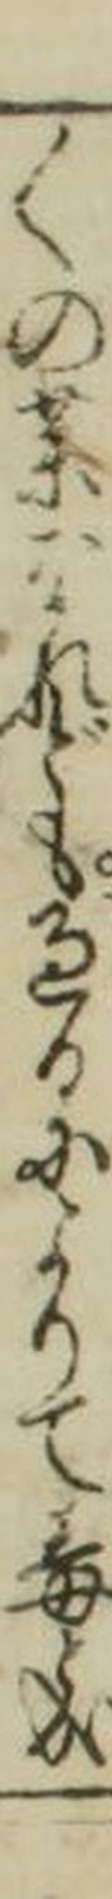〳〵の薬なれども。過るによりて毒と成。
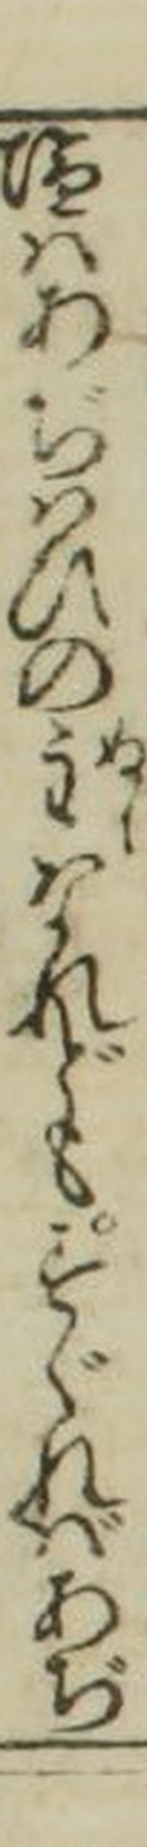塩はあぢはひの主なれども。すぐればあぢ
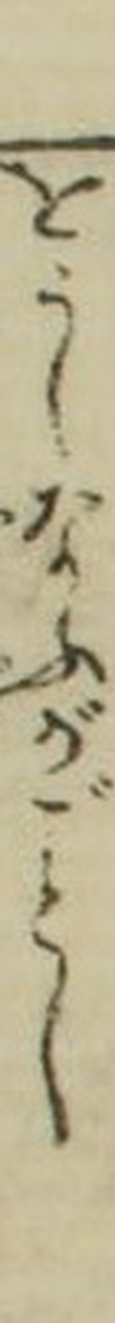をうしなふがごとし
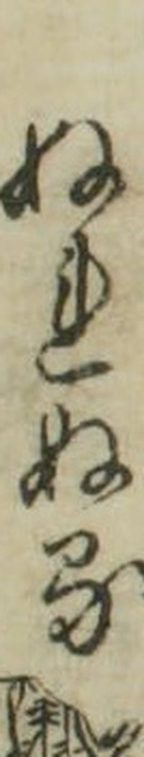ぬれぬる
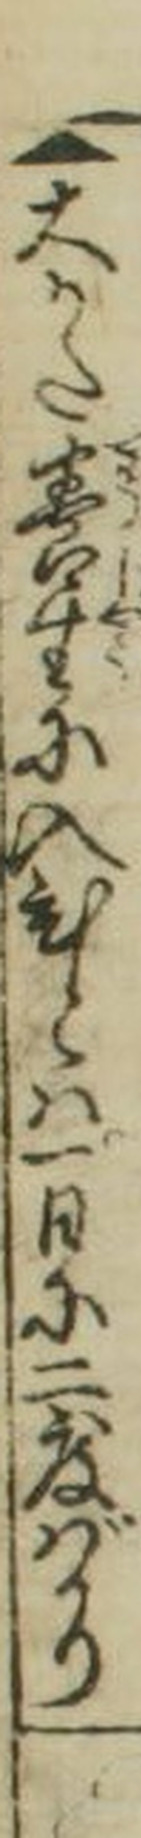▲大かた養生に入ひとは。一日に二度ばかり

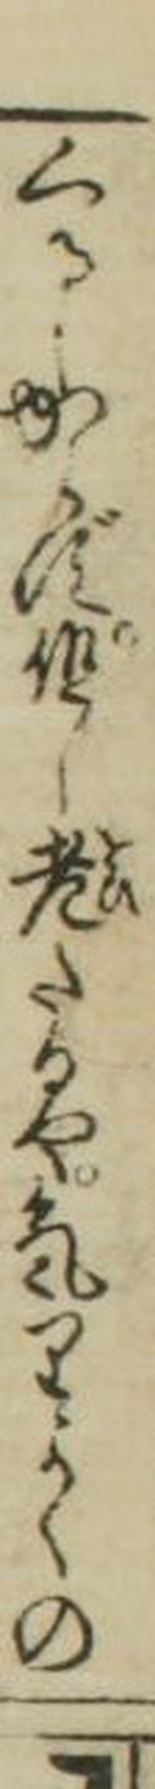くるしからず。但し老たるや。気りよくの
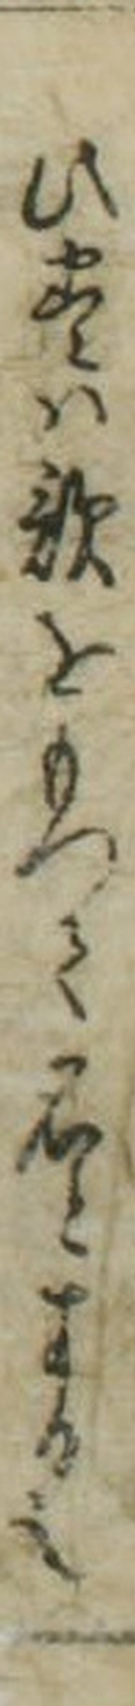此巻は歌をもつて名とする也
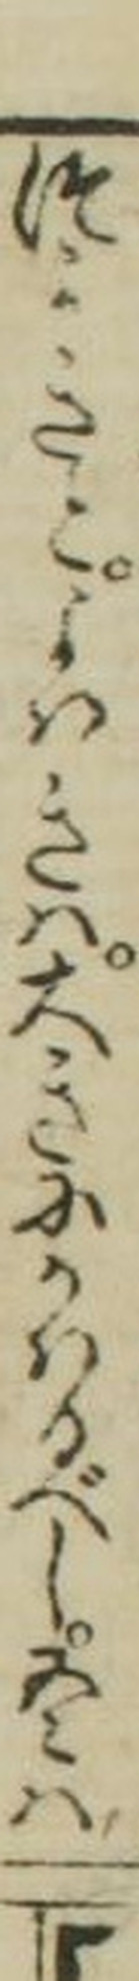つよきと。よはきは。大きにかはるべし。冬は
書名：女源氏教訓鑑
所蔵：東京学芸大学附属図書館
